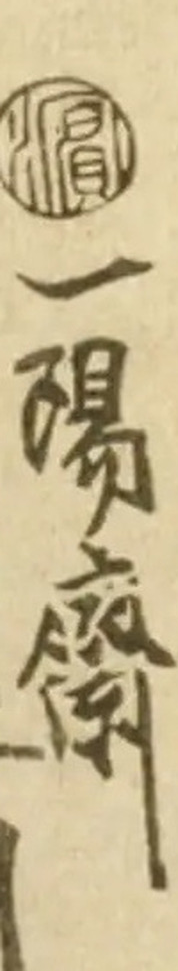一陽斎
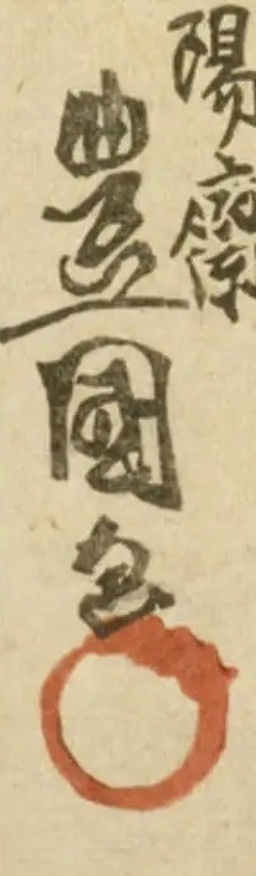豊国画
